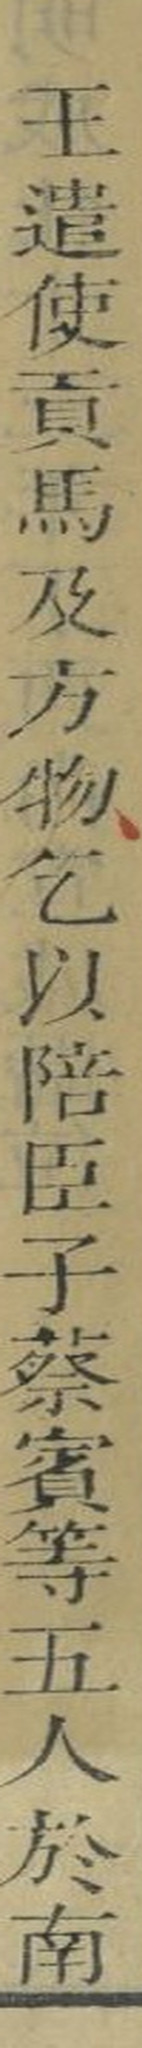王遣使貢馬及方物乞以陪臣子蔡賓等五入於南
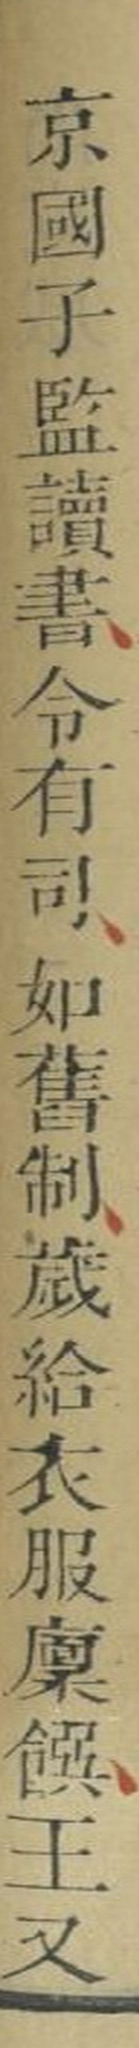京国子監読書令有司如旧制歳給衣服廩饌王又
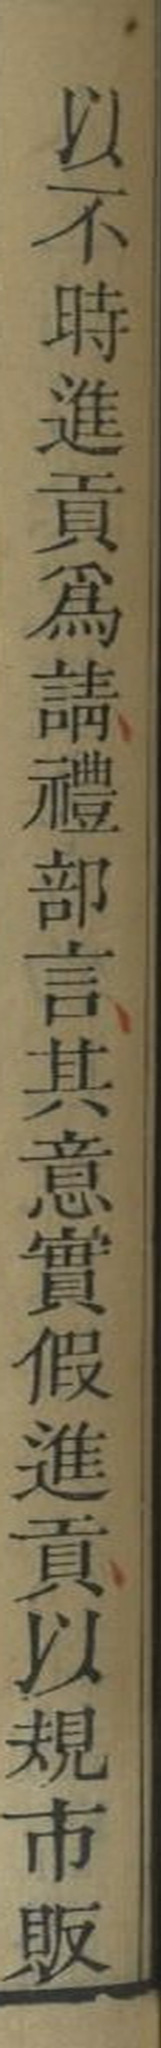以不時進貢為請礼部言其意実仮進貢以規市販
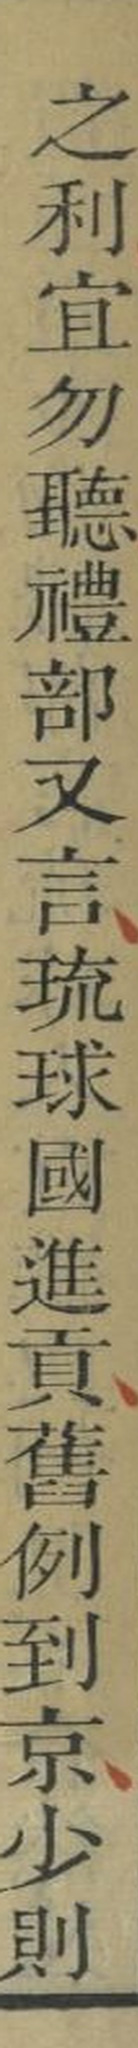之利宜勿聴礼部又言琉球国進貢旧例到京少則
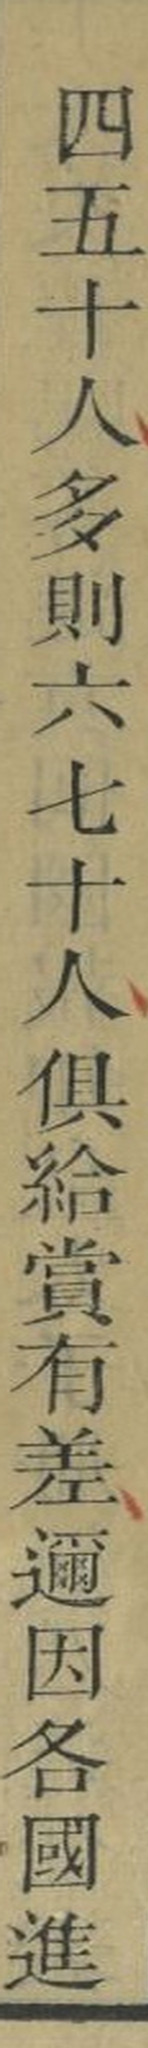四五十人多則六七十人俱給賞有差邇因各国進
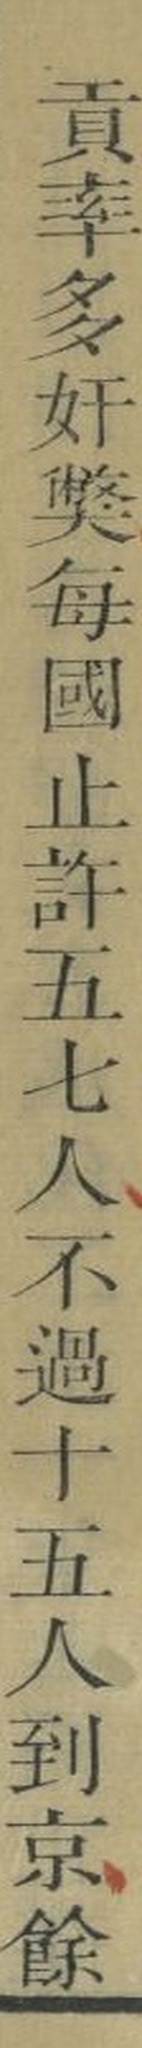貢率多奸獘毎国止許五七人不過十五人到京余
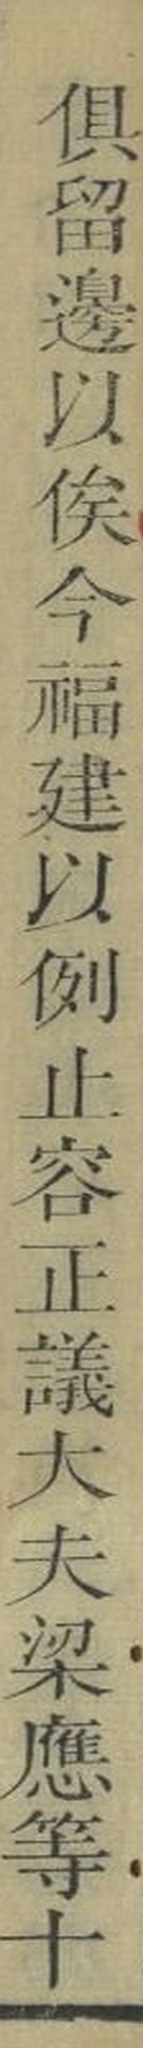俱留辺以俟今福建以例止容正議大夫梁応等十
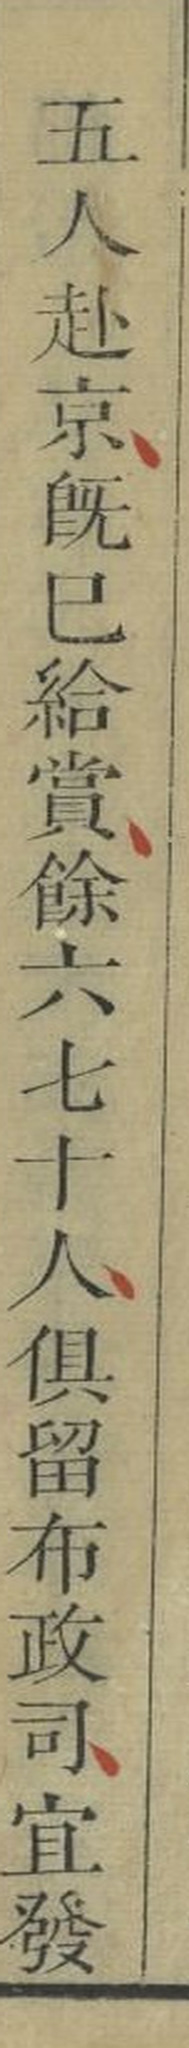五人赴京既巳給賞余六七十人俱留布政司宜発
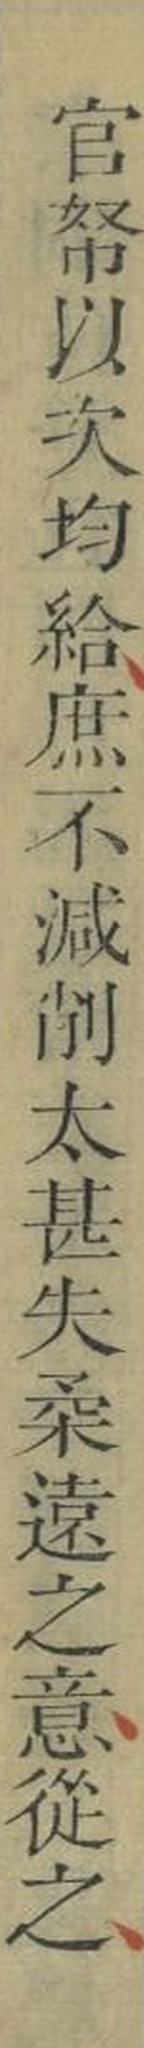官帑以次均給庶不減削太甚失柔遠之意従之
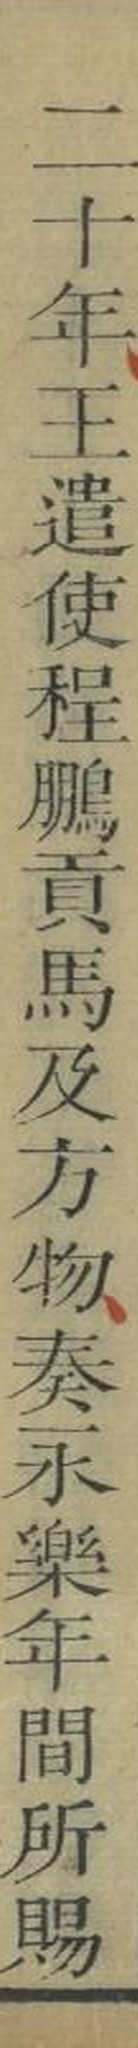二十年王遣使程鵬貢馬及方物奏永楽年間所賜
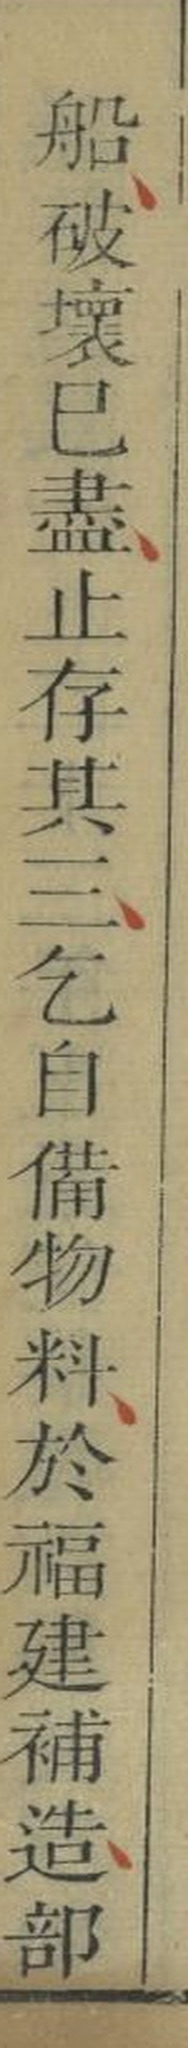船破壊巳尽止存其三乞自備物料於福建補造部

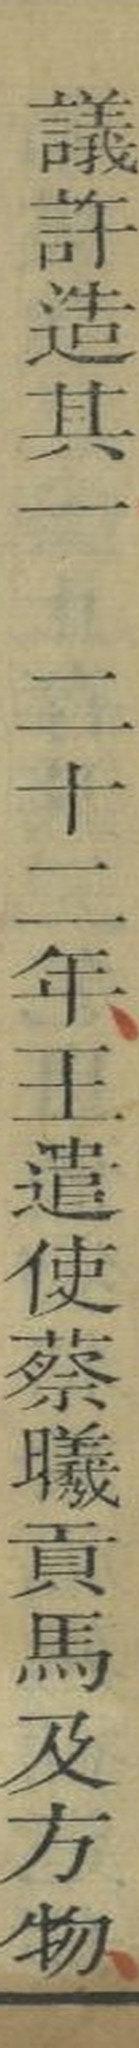義許造其一二十二年王遣使蔡䂀貢馬及方物
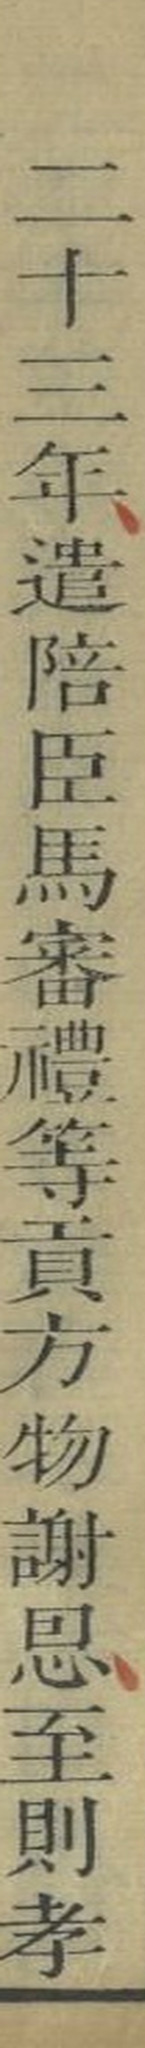二十三年遣陪臣馬審礼等貢方物謝恩至則孝
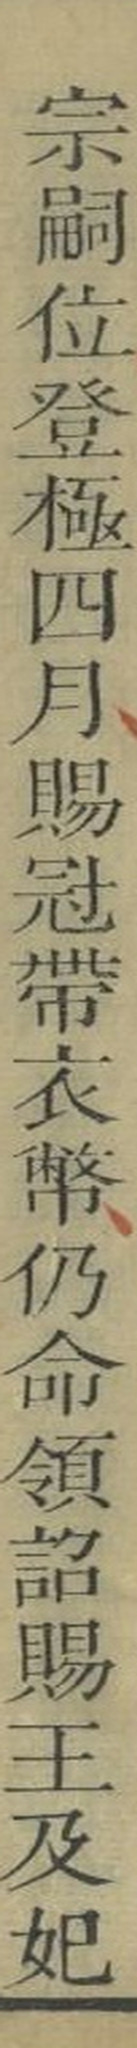宗嗣位登極四月賜冠帯衣幣仍命領詔賜王及妃
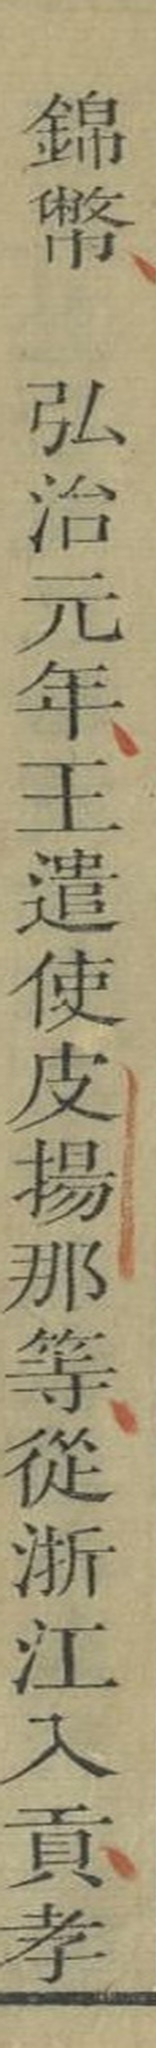錦幣弘治元年王遣使皮揚那等従浙江入貢孝
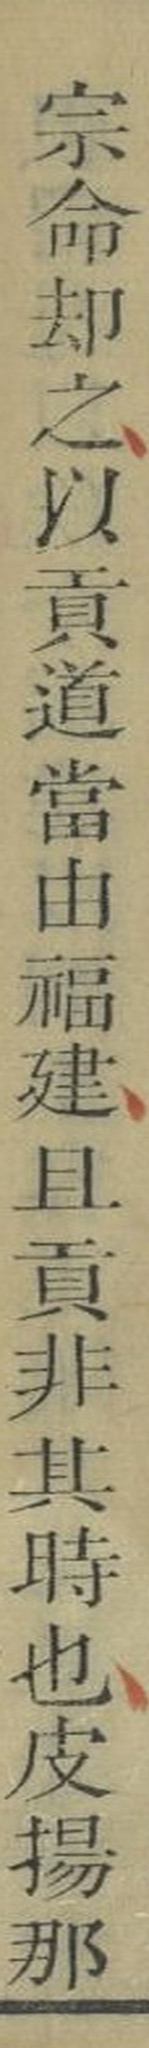宗命却之以貢道当由福建且貢非其時也皮揚那
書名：中山伝信録 巻三
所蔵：University of the Ryukyus Library
